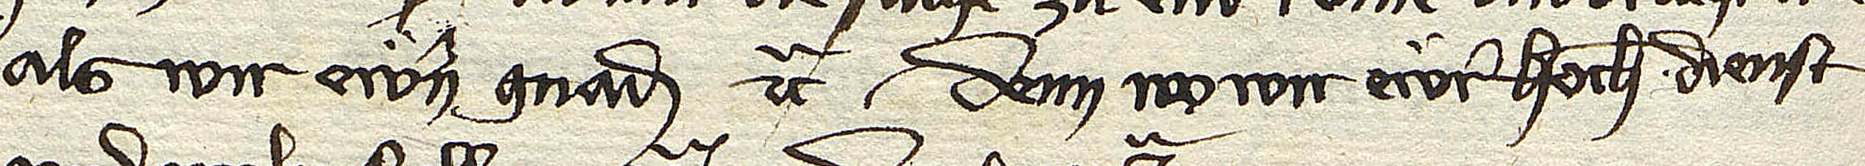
als wir eẅn* gnad* ec* / Denn wo wir eẅr* hoch* . dienſt
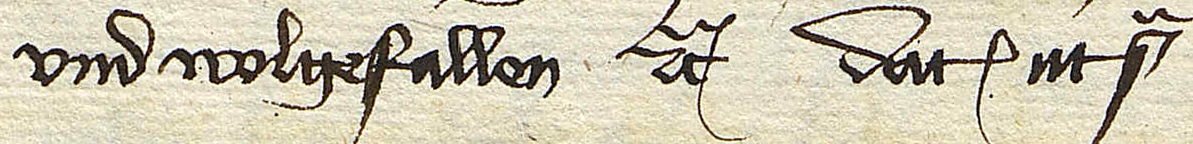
vnd wolgefallen ec* Dat ut ſ*
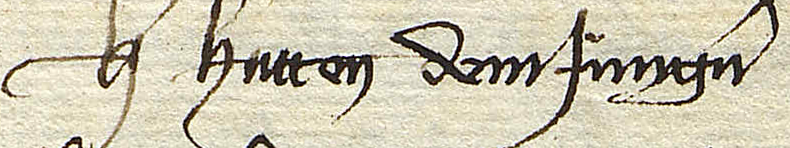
H* Hutten dem Iüngn*
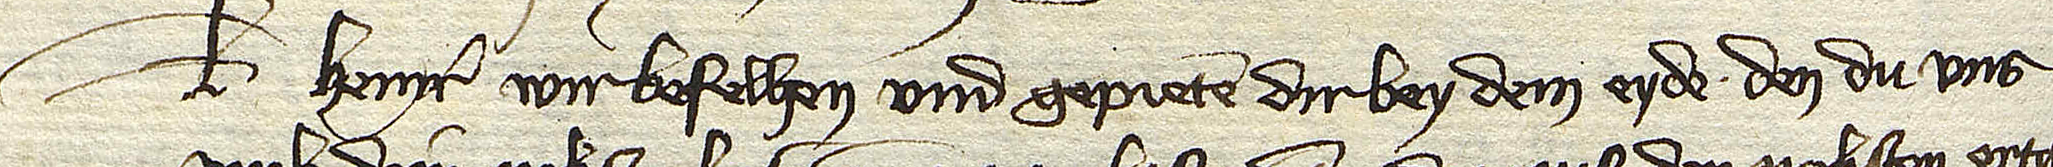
L* heinr* wir befelhen vnd gepiete* dir bey dem eyde . den du vns
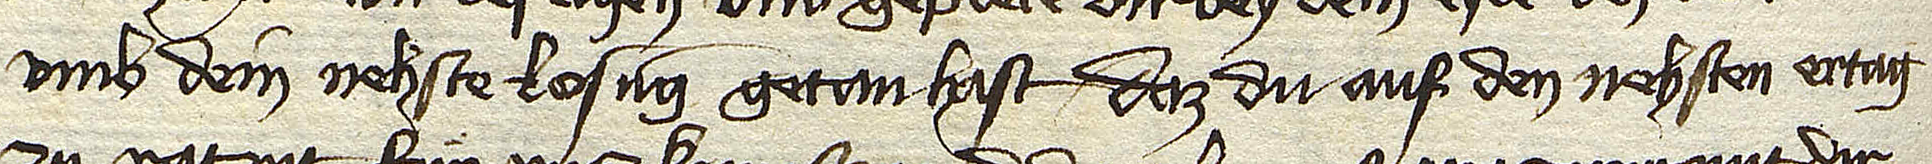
vmb dein nehſte loſug* getan haſt / daʒ du auf den nehſten ertag
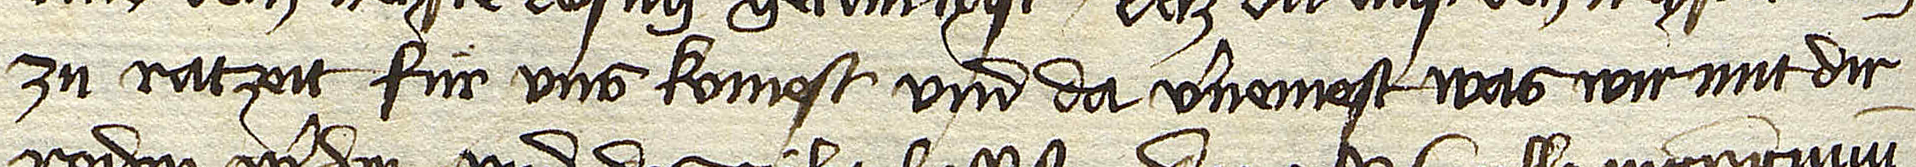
ʒu ratʒeit für vns komeſt vnd da vnemeſt* was wir mit dir
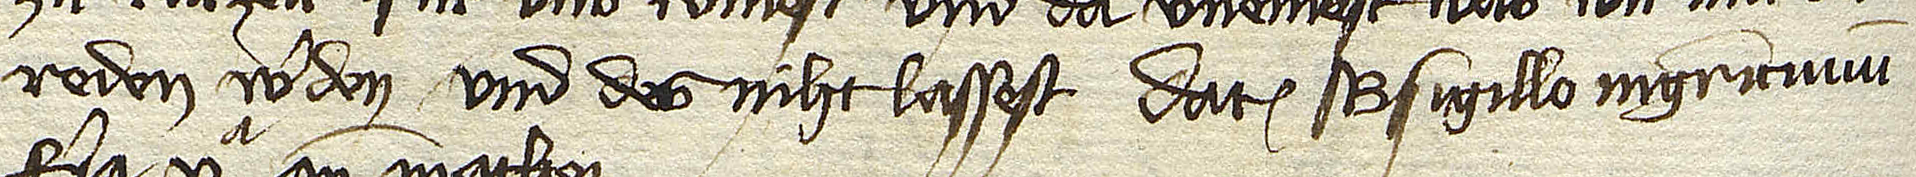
reden w*den vnd des niht laſſeſt Dat* ſb* ſigillo mgriciuiu*
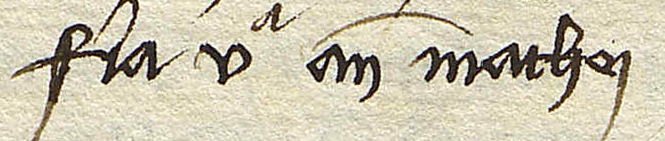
fia* v* an* mathei
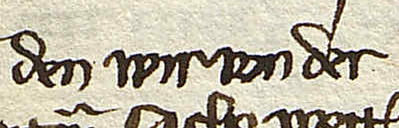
den wir von der
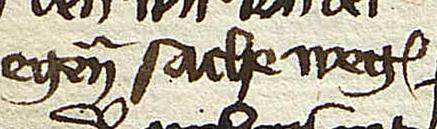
egen* ſache weg*
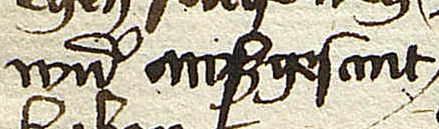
wid* auſʒgeſant
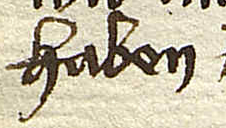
haben
